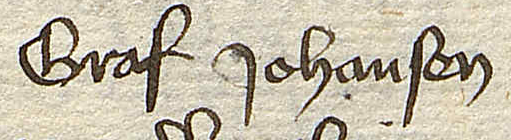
Graf Iohanſen
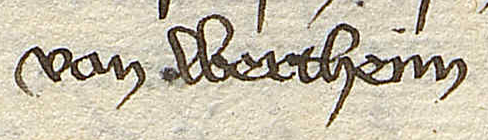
von Wertheim
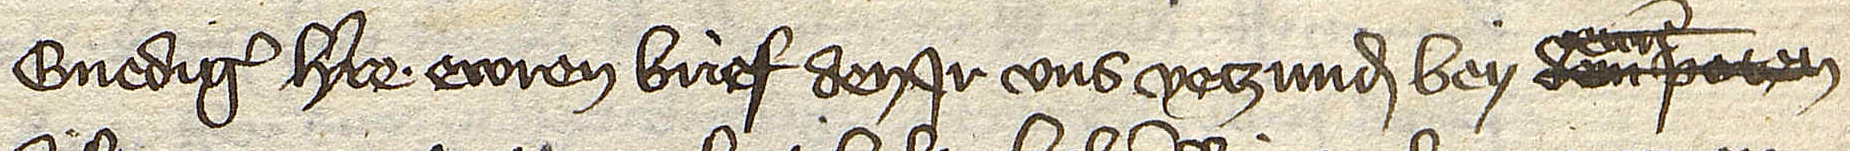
Gnedig* h*re. ewren brief den Ir vns yecʒund* bey dem poten
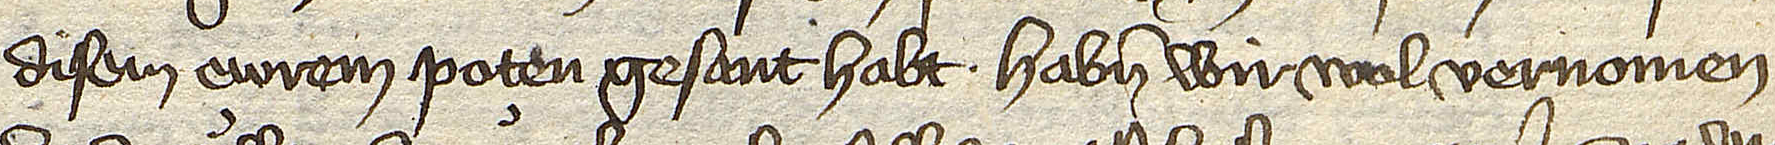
diſem ewren poten geſant habt . habn* wir wol vernomen
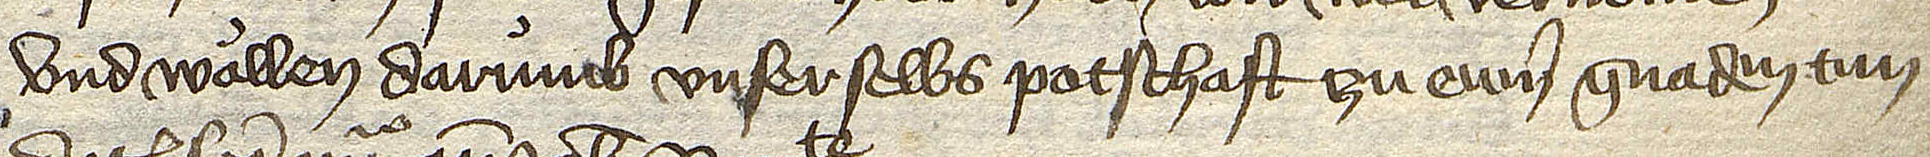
vnd wöllen darümb vnſer ſelbs potſchaft cʒu ewn* gnaden tun
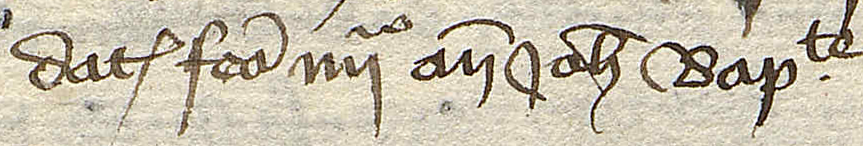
dat* fea* iiii* an* Ioh* Bap* .
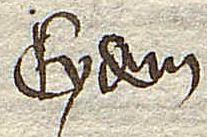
Eyden
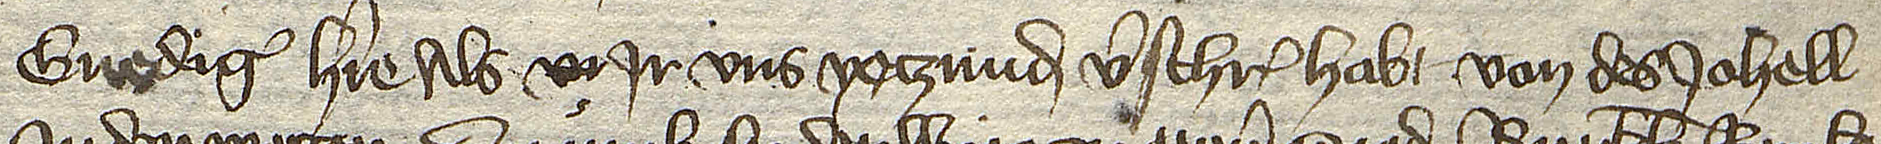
Gnedig* h*re Als vn Ir vns yecʒund* v*ſchr* habt von des Iohell
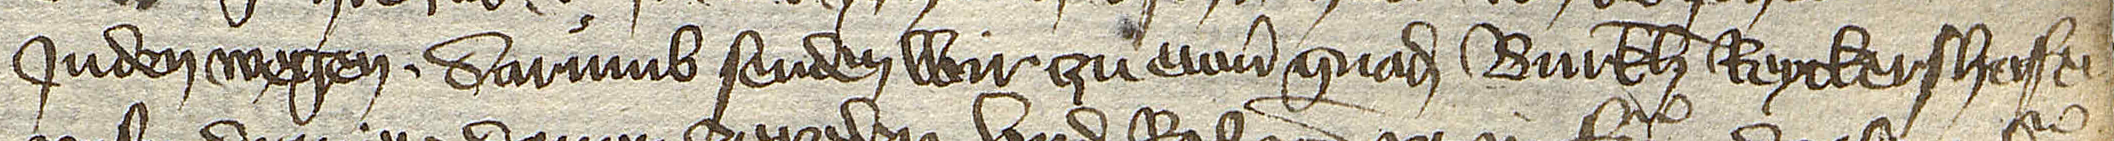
Iuden wegen . Darümb ſenden wir cʒu ewn* gnad* Burkh* Reyckerſhofer
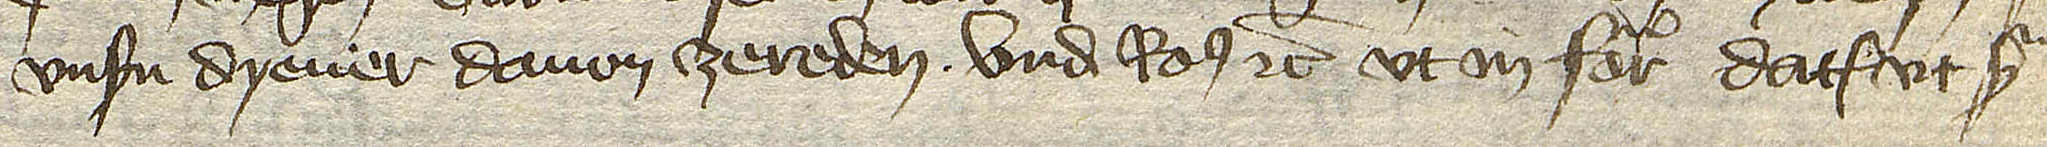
vnſ*n dyener daruon cʒereden . Vnd Ro* ec* vt in for* Dat* vt ſ*
